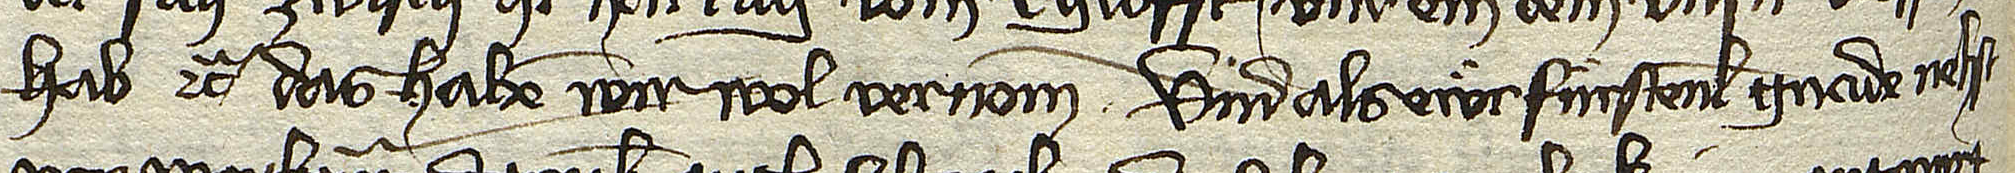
hab ec* / das habe* wir wol vernom* Vnd als eẅr fürſtenl* gnade nehſt
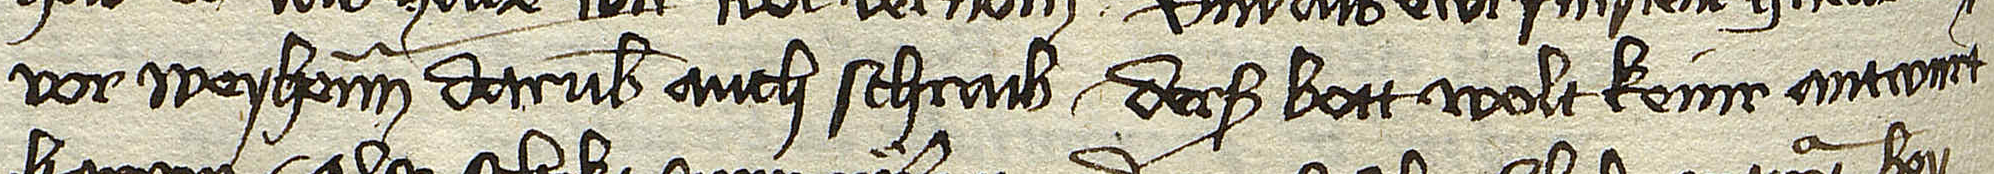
vor weyheim* darub* auch ſchraib / derſ* bott wolt keinr antwurt
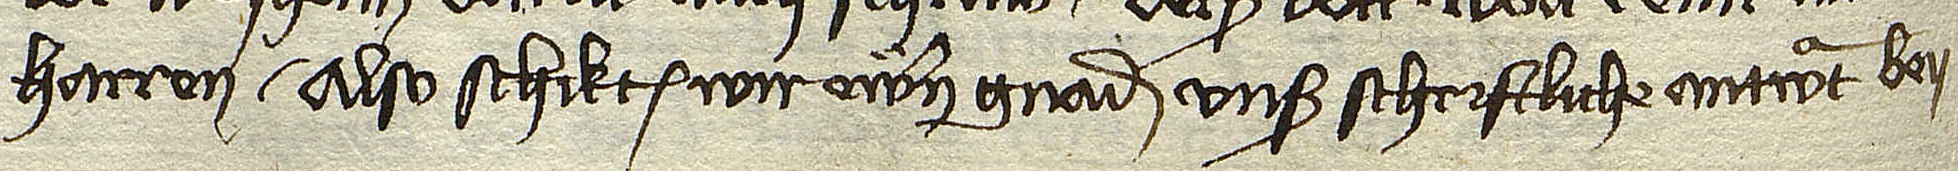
harren / Alſo ſchikt* wir eẅ*n gnad* vnſ* ſchriftliche antw*t bey
